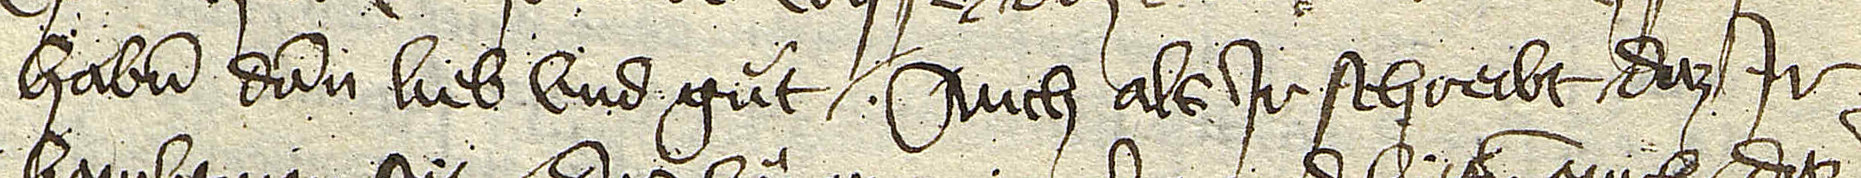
habn* da*n lieb vnd güt / . Auch als Ir ſchreibt / daʒ Ir
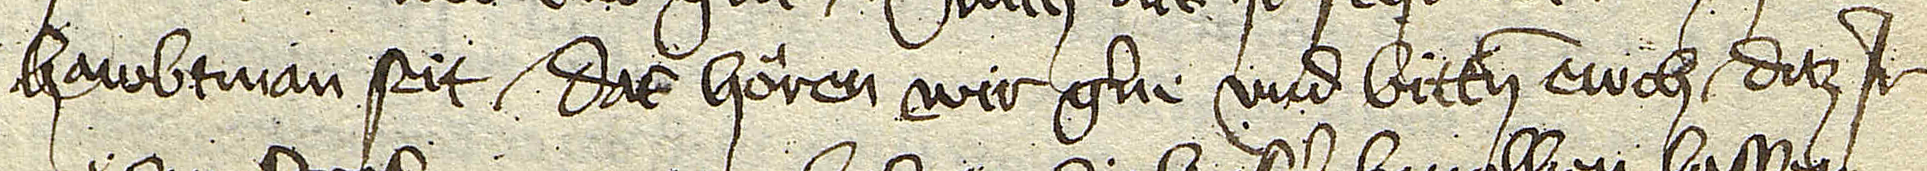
hawbtman ſeit / das hören wir g*ne vnd bittn* ewch / daʒ Ir
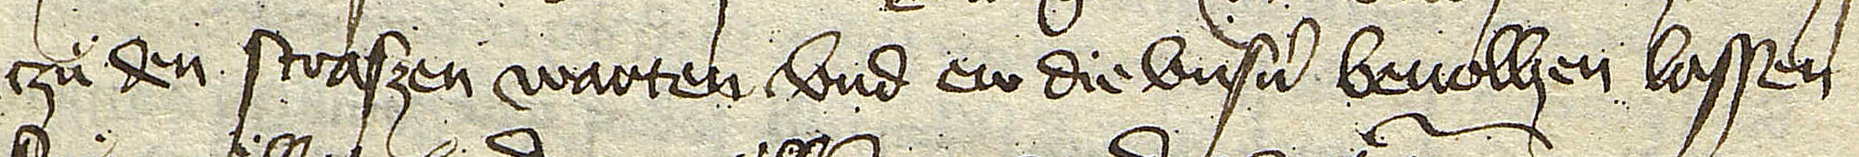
cʒü den ſtraſʒen warten / vnd ew die vnſn* beuolhen laſſen
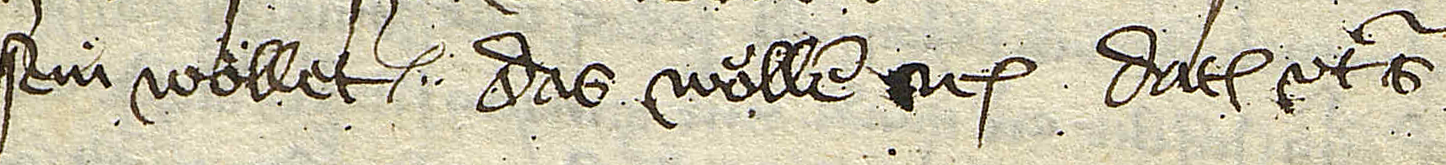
ſein wöllet / . das wölle* ec* dat* vt s*
